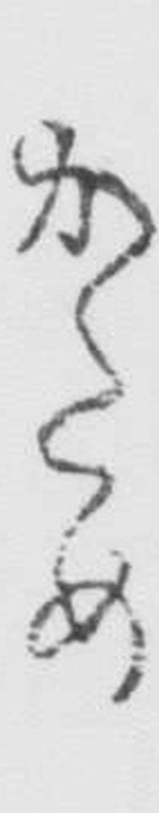かため
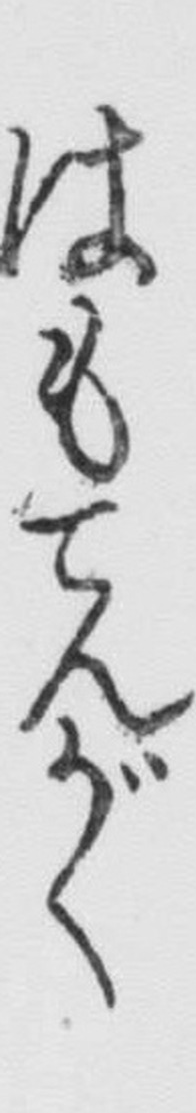はもてんがく
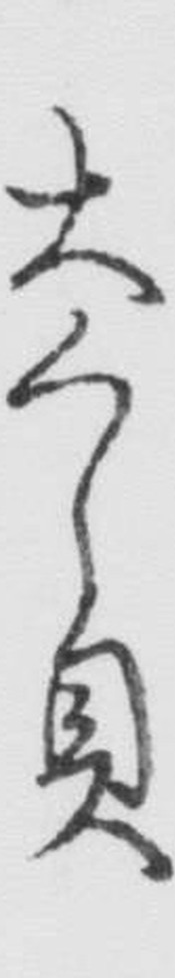大くし貝
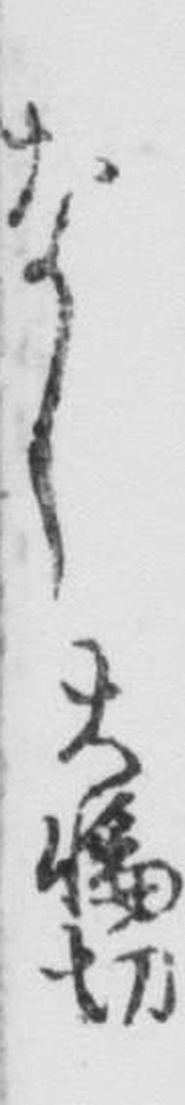なし大輪切
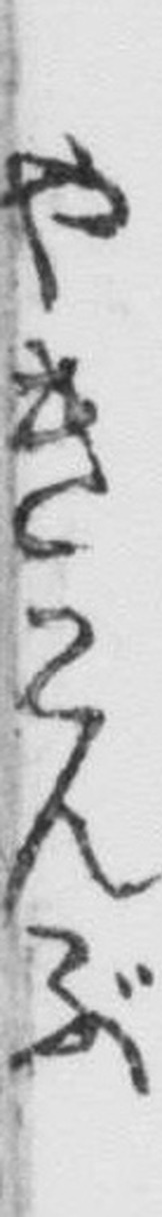やきこんぶ
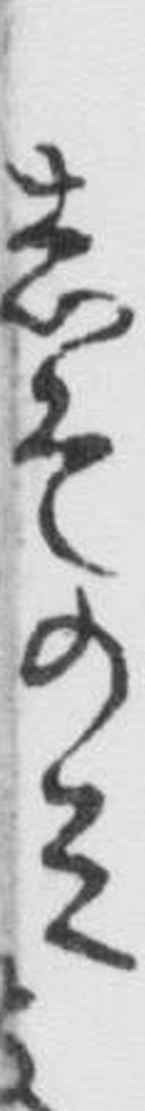しそのみ
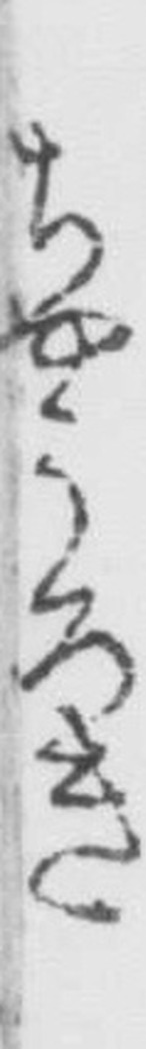ちやうろき

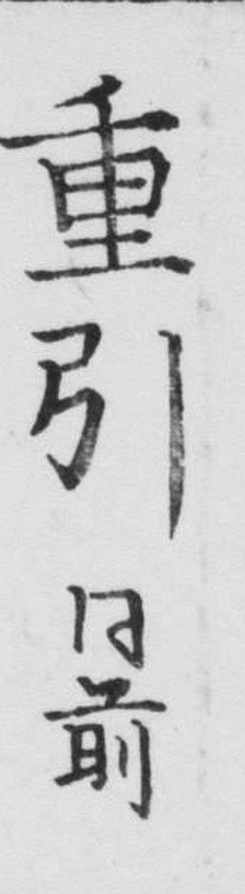重引同前
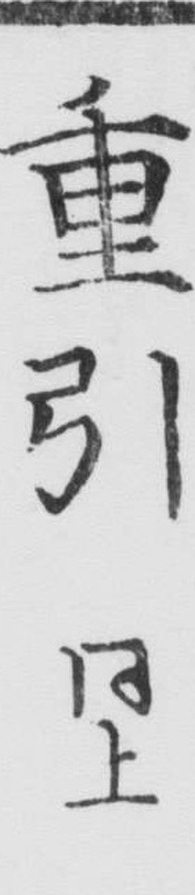重引同上
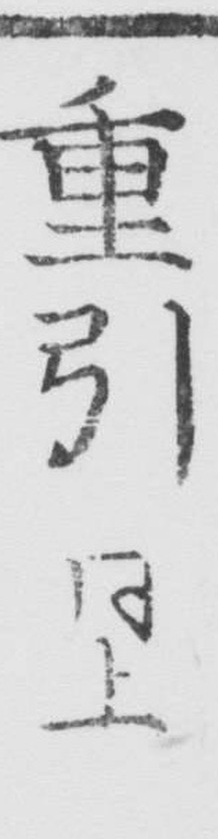重引同上
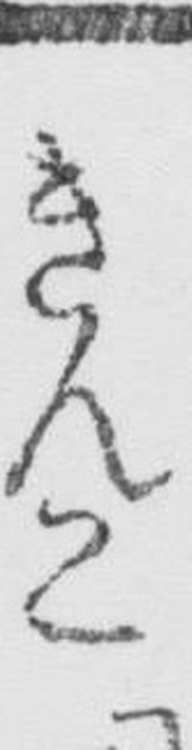きんこ
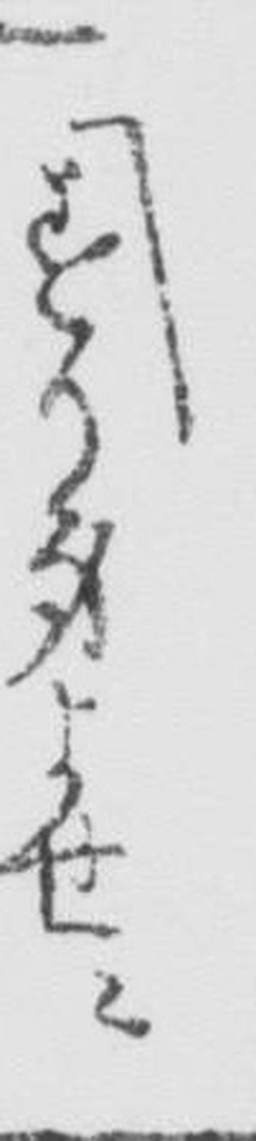〽すりみよせに
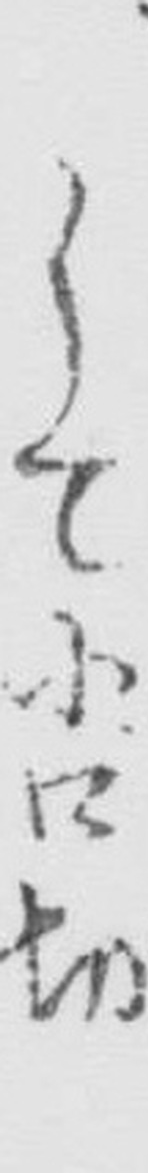して小口切
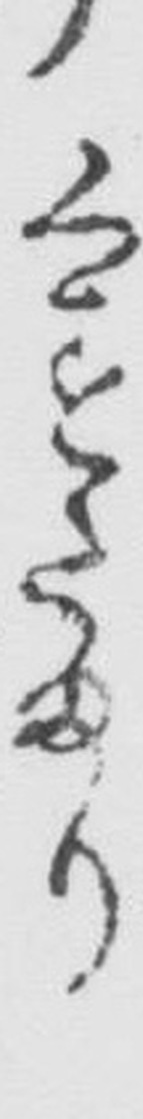くすたまり
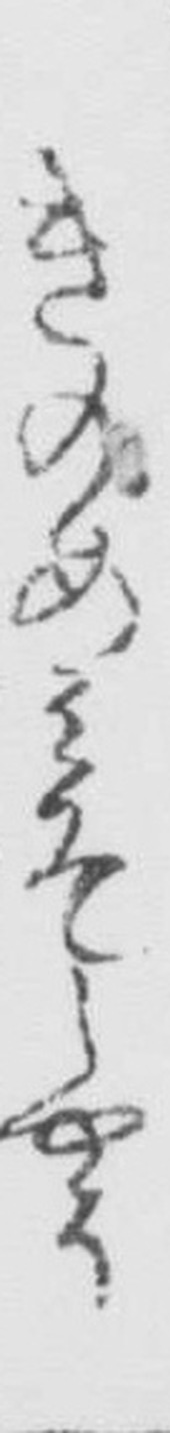きのめみそしやう
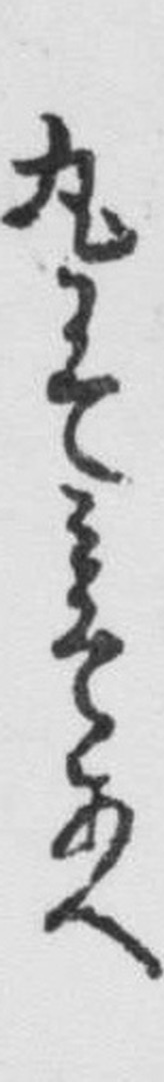丸にてみそあへ
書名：諸家通用/即席料理
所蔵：大阪府立大学学術情報センター 国文学研究資料館
